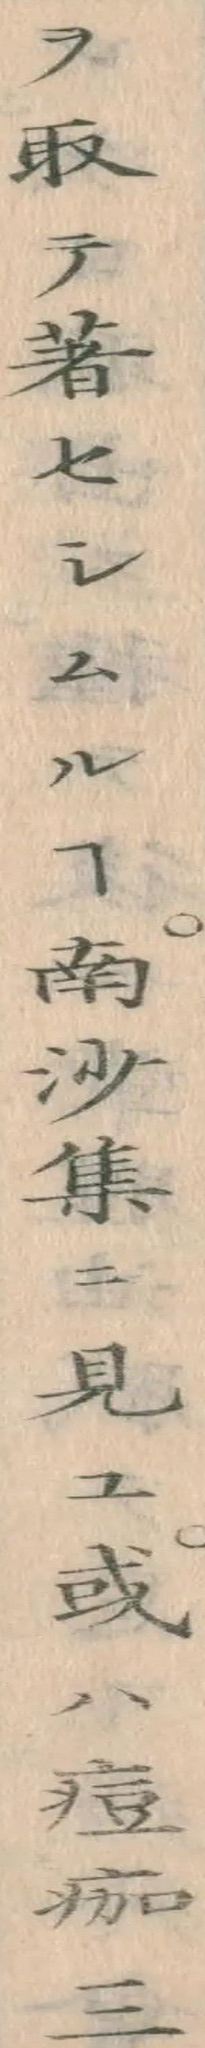ヲ取テ著セシムルヿ。南沙集ニ見ユ。或ハ痘痂三
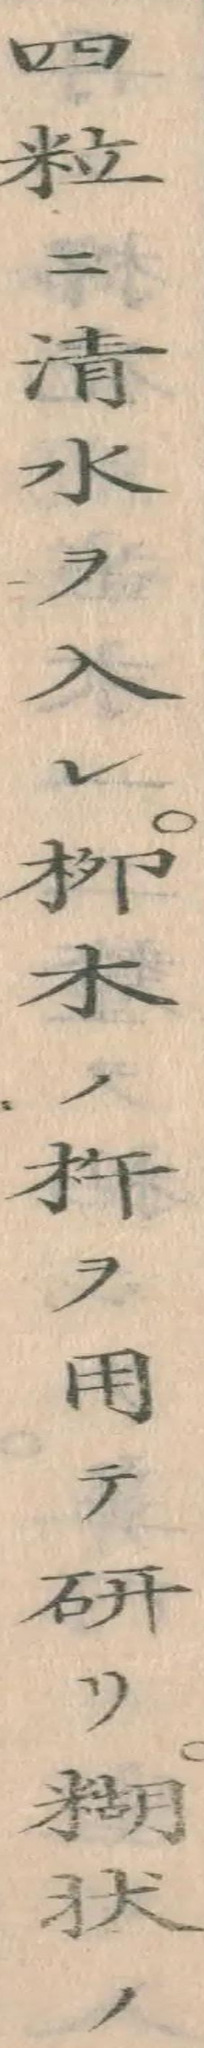四粒ニ清水ヲ入レ。柳木ノ杵ヲ用テ研リ。糊状ノ
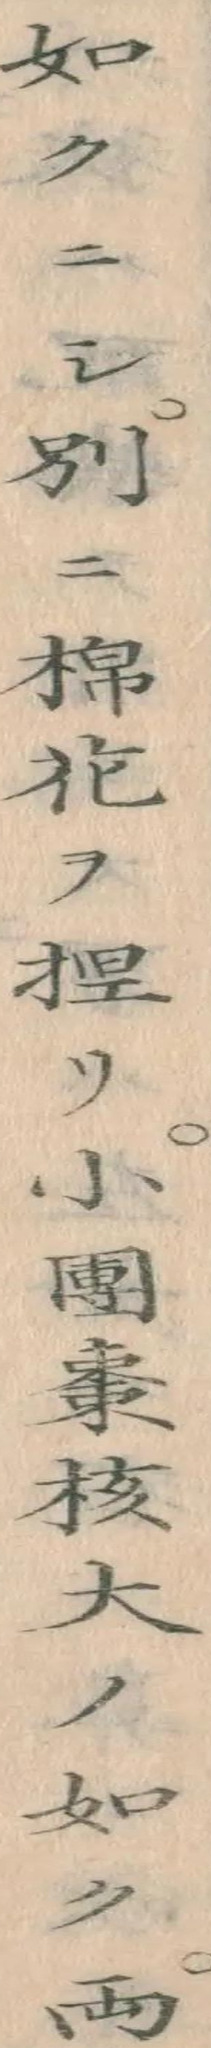如クニシ。別ニ棉花ヲ▢リ。小団棗核大ノ如ク。両
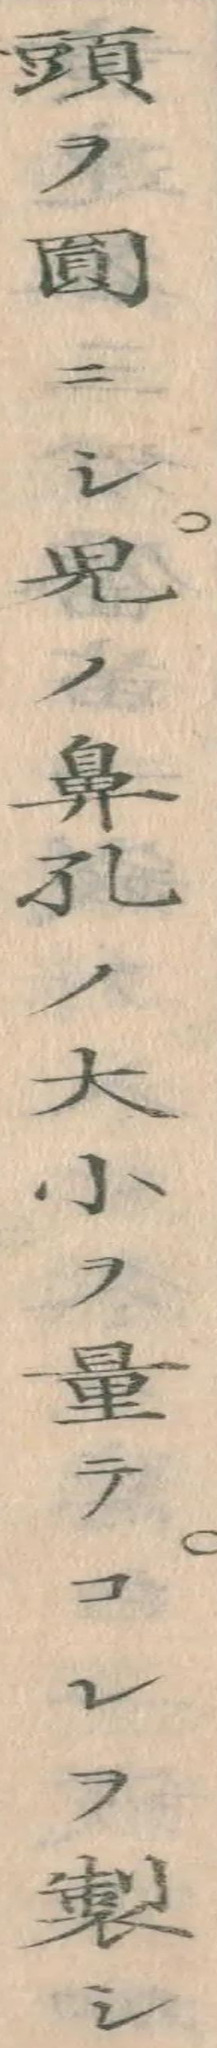頭ヲ円ニシ。児ノ鼻孔ノ大小ヲ量テ。コレヲ製シ
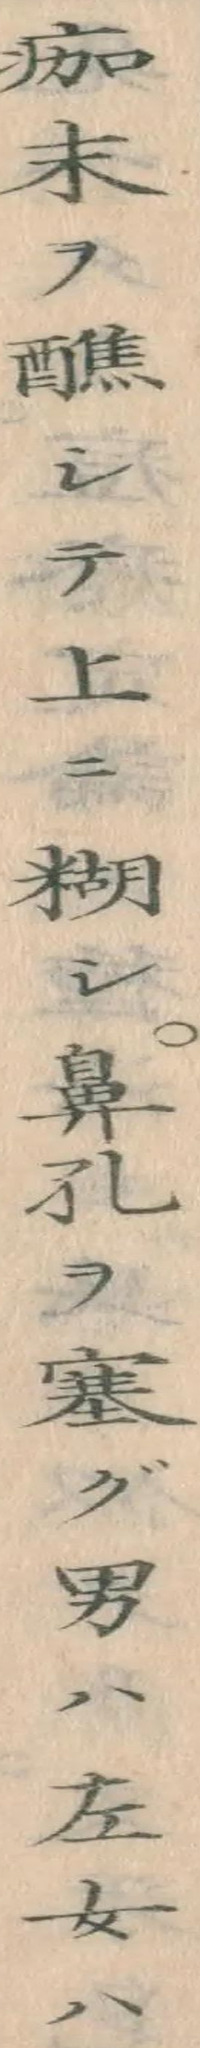痂末ヲ醮シテ上ニ糊シ。鼻孔ヲ塞グ男ハ左女ハ
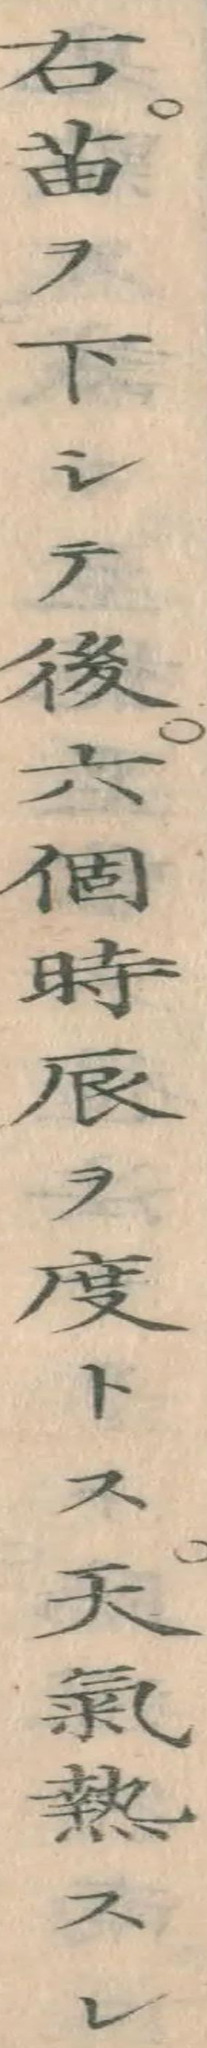右。苗ヲ下シテ後。六個時辰ヲ度トス。天気熱スレ
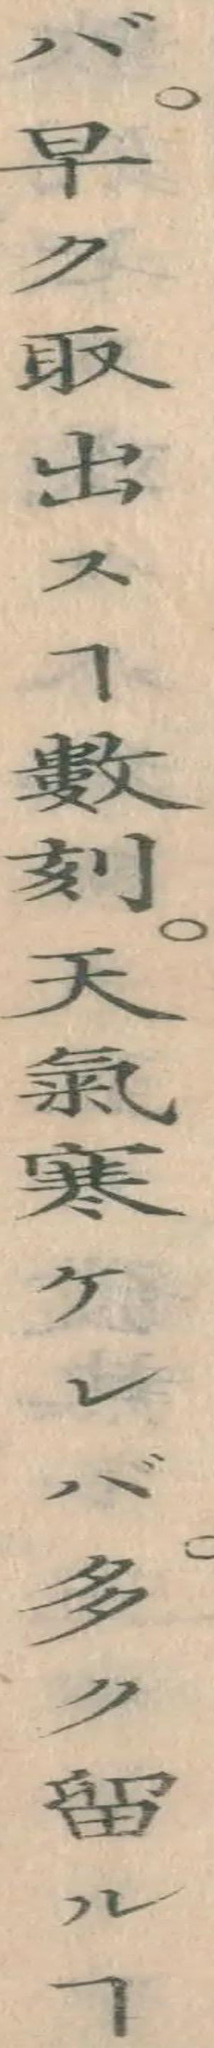バ。早ク取出スヿ数刻。天気寒ケレバ多ク留ルヿ

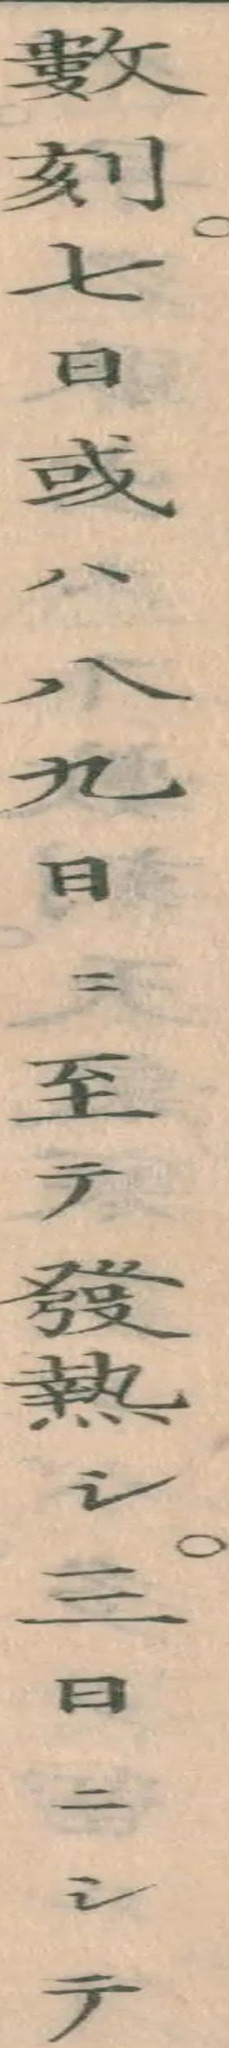数刻。七日或ハ八九日ニ至テ発熱シ。三日ニシテ
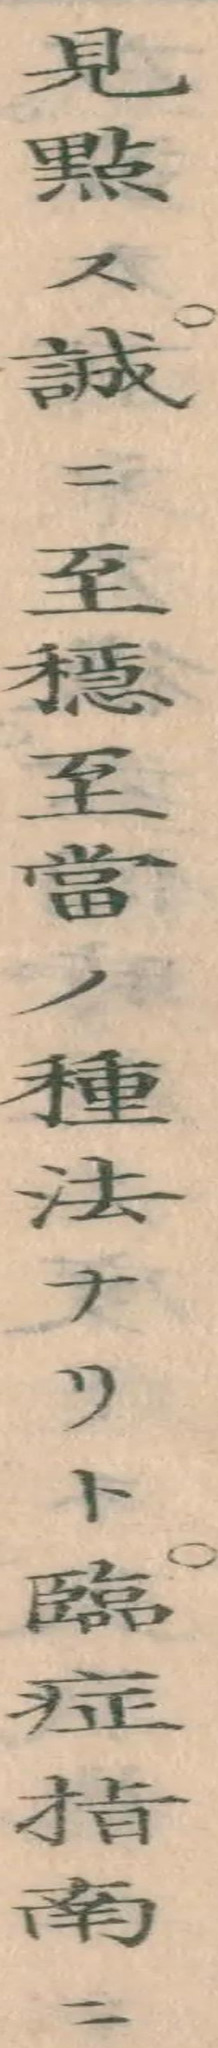見点ス。誠ニ至穏至当ノ種法ナリト。臨症指南ニ
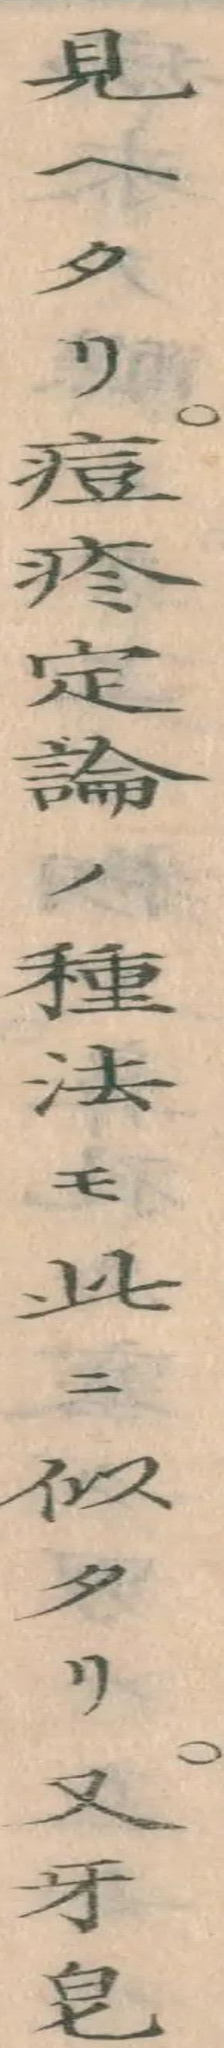見ヘタリ。痘疹定論ノ種法モ此ニ似タリ。又牙皂
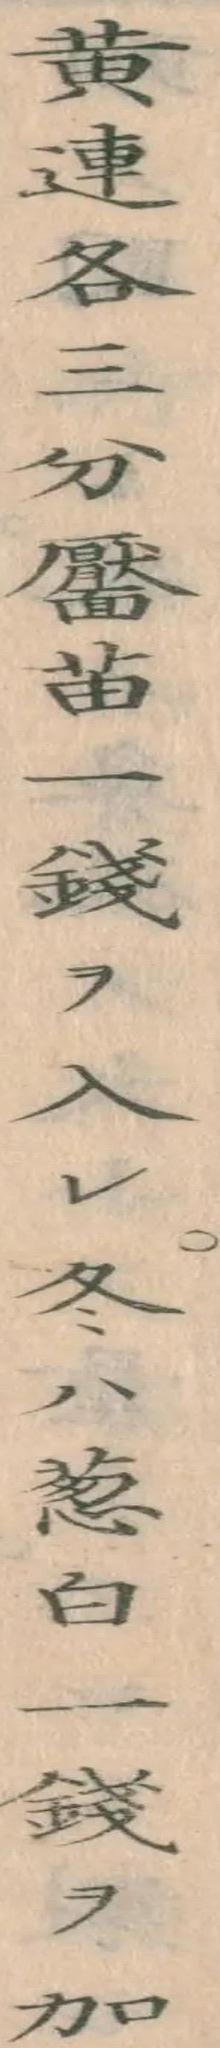黄連各三分靨苗一銭ヲ入レ。冬ハ葱白一銭ヲ加
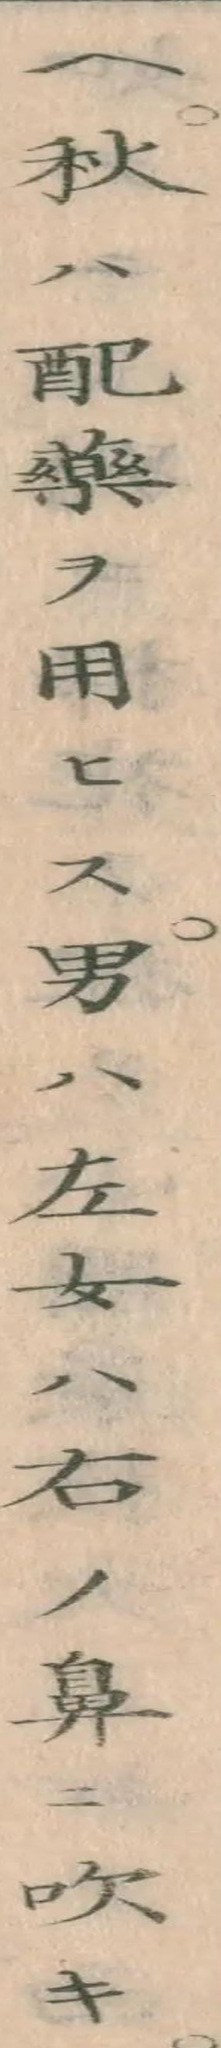ヘ。秋ハ配薬ヲ用ヒス。男ハ左女ハ右ノ鼻ニ吹キ。
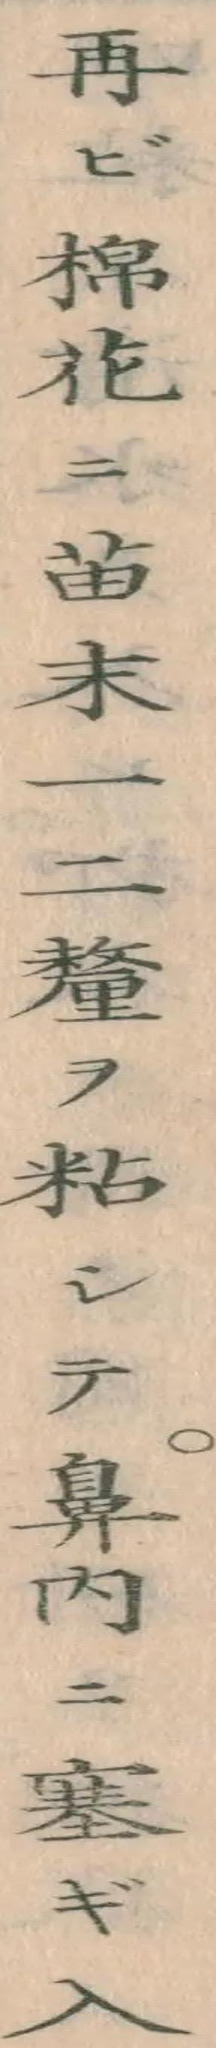再ビ棉花ニ苗末一二釐ヲ粘シテ。鼻内ニ塞ギ入
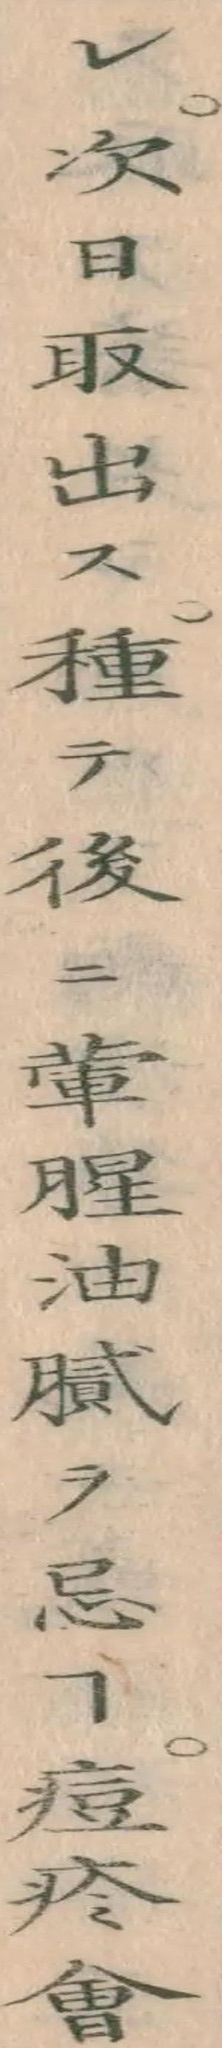レ。次日取出ス。種テ後ニ葷腥油膩ヲ忌ヿ。痘疹会
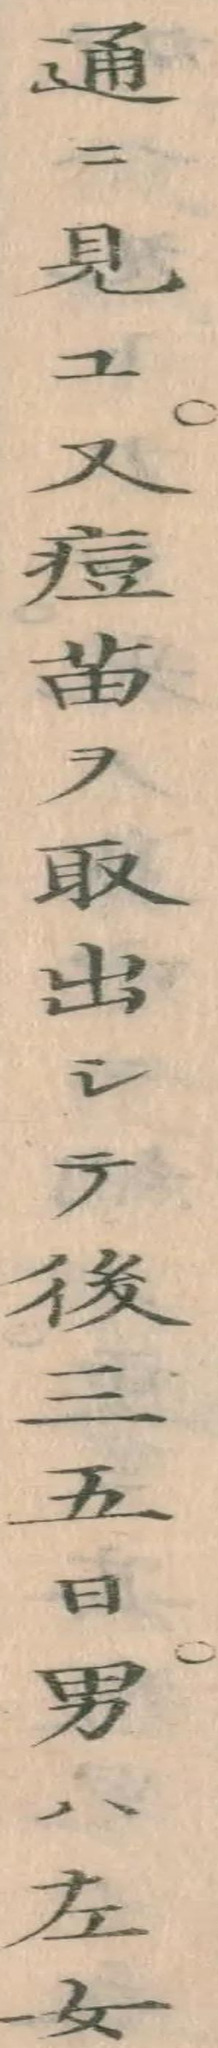通ニ見ユ。又痘苗ヲ取出シテ後三五日男ハ左女
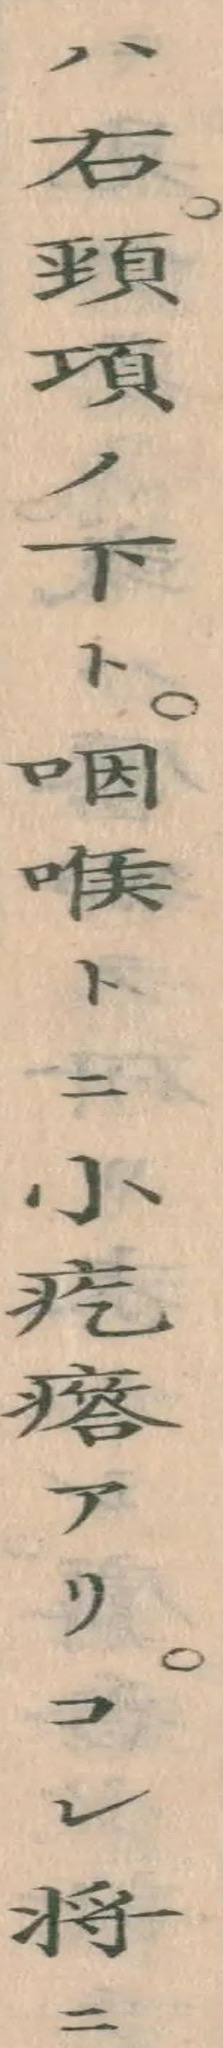ハ右。頸項ノ下ト。咽喉トニ小疙瘩アリ。コレ将ニ
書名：種痘弁義
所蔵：国立国会図書館 National Diet Library, JAPAN
